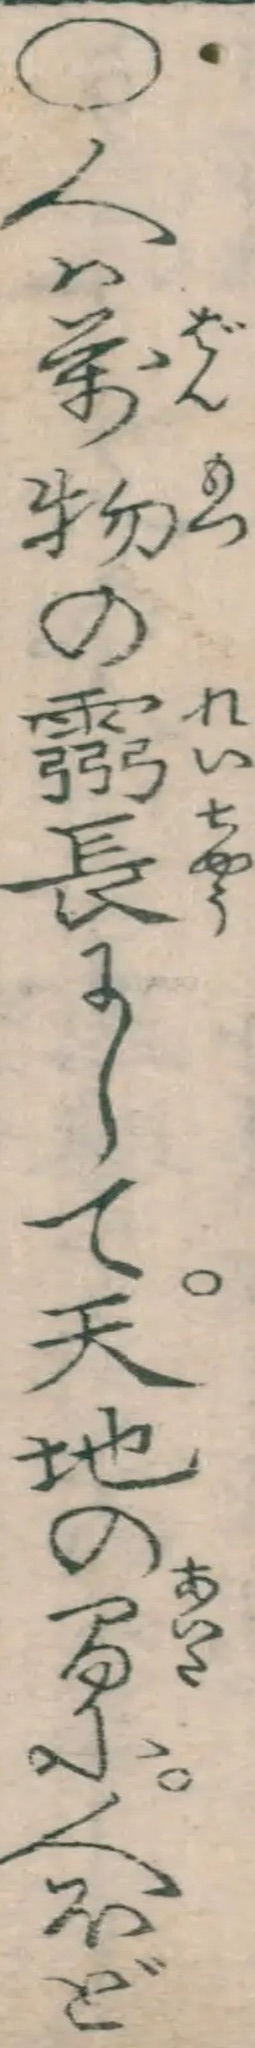〇人は萬物の霊長にして。天地の間に。人ほど
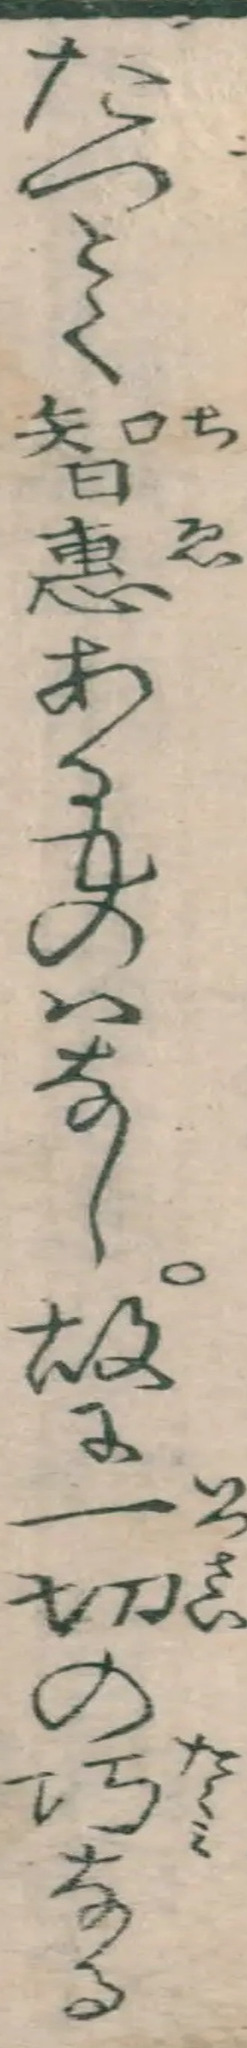たつとく智恵あるものなし。故に一切の巧なる

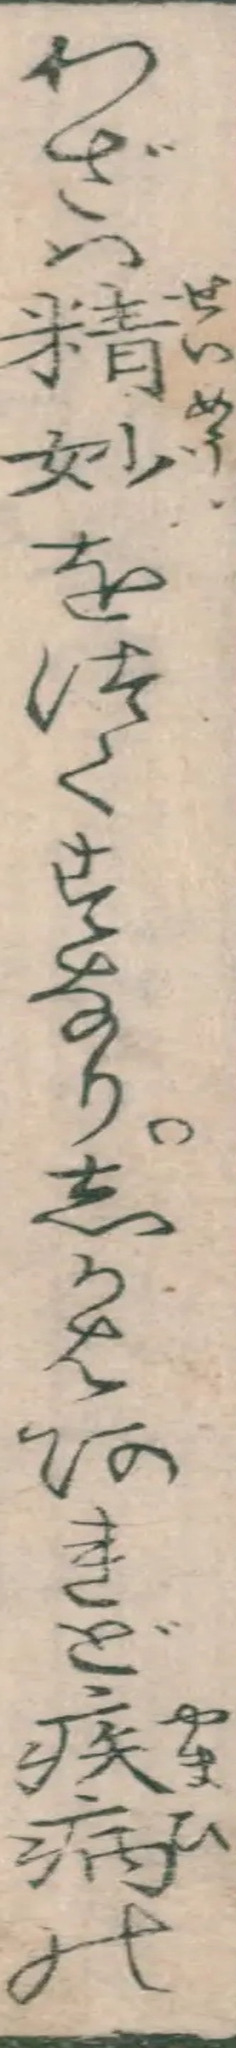わざは精妙をつくすなり。しかはあれど疾病の
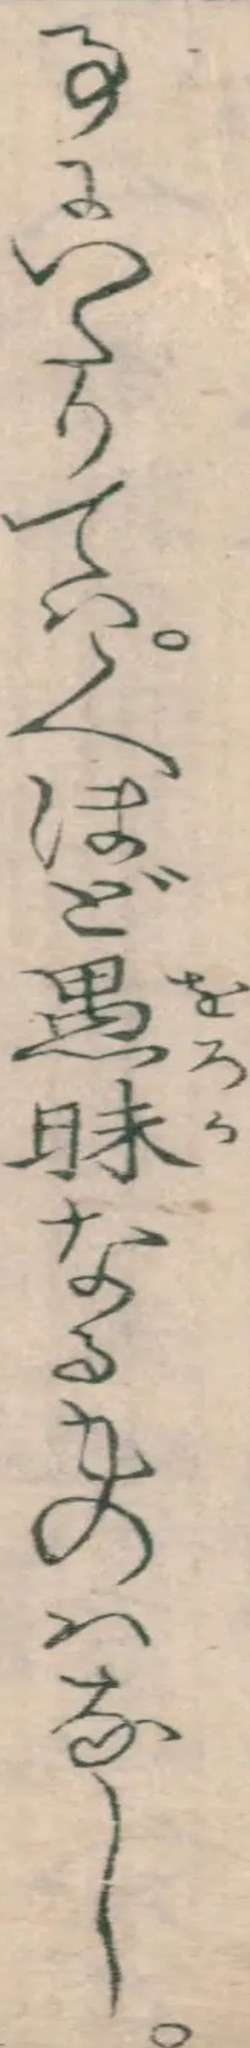事にいたりては。人ほど愚昧なるものはなし。
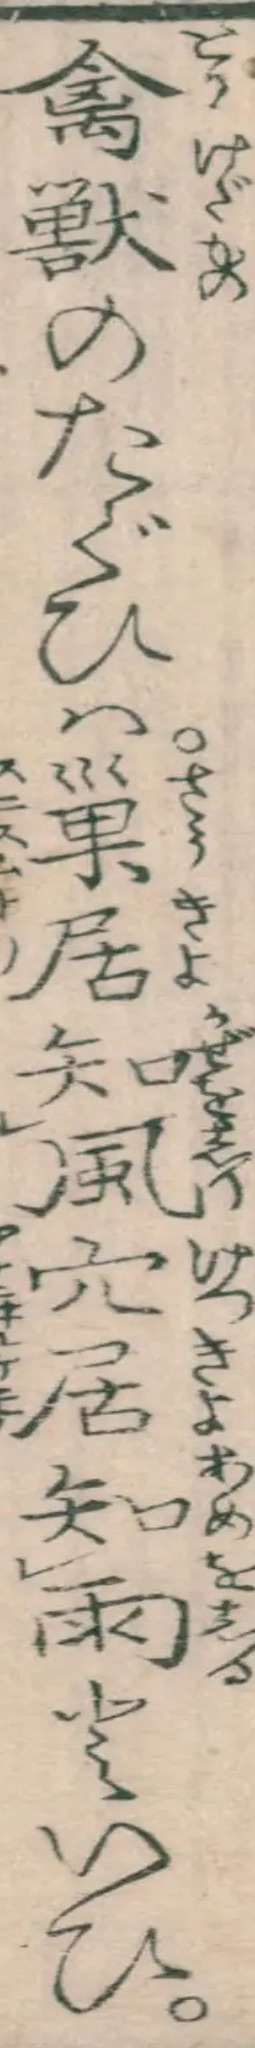禽獣のたぐひは。巣居知風穴居知雨といひ。
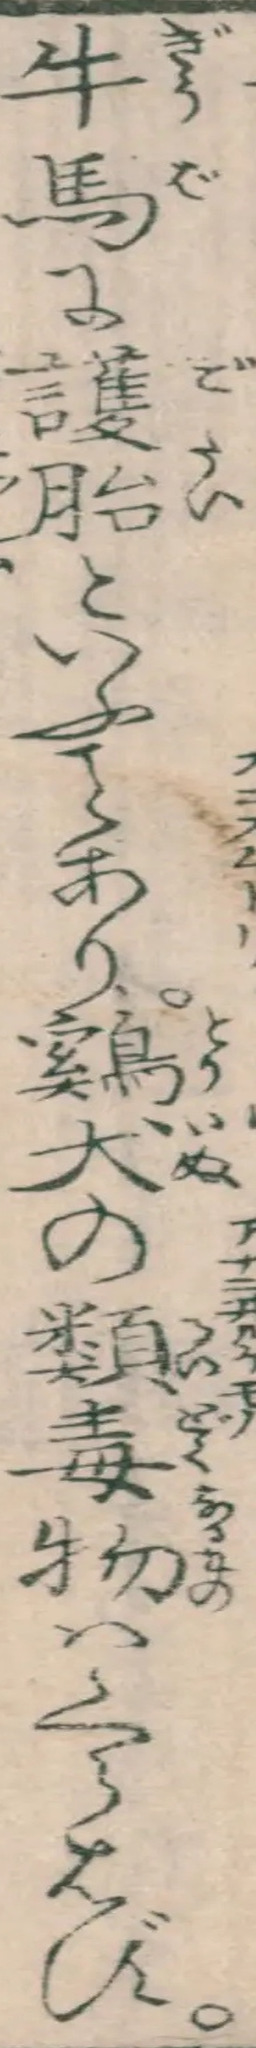牛馬に護胎といふことあり。鷄犬の類毒物はくらはず。
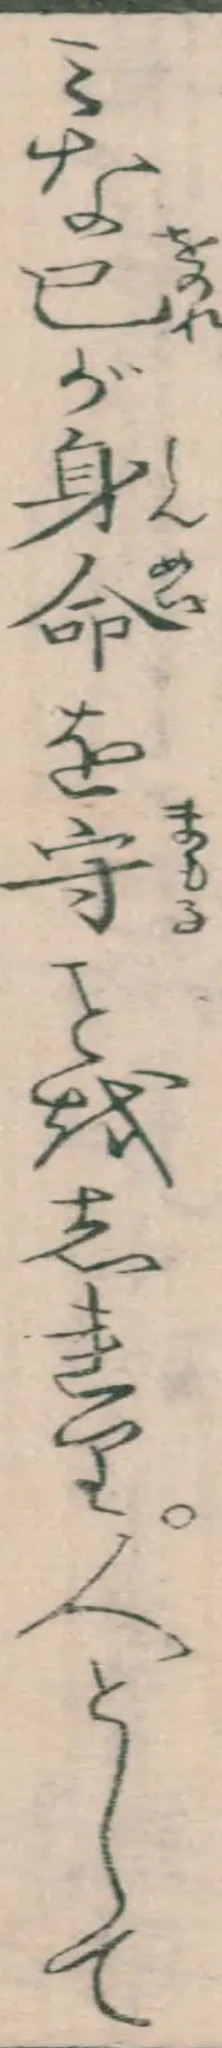みな己が身命を守ことをしれり。人として
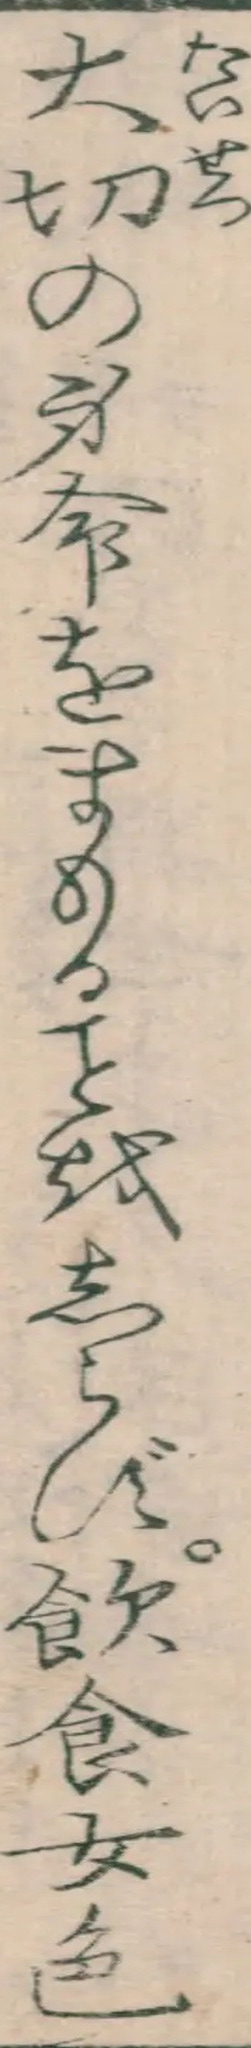大切の身命をまもることをしらず。飲食女色
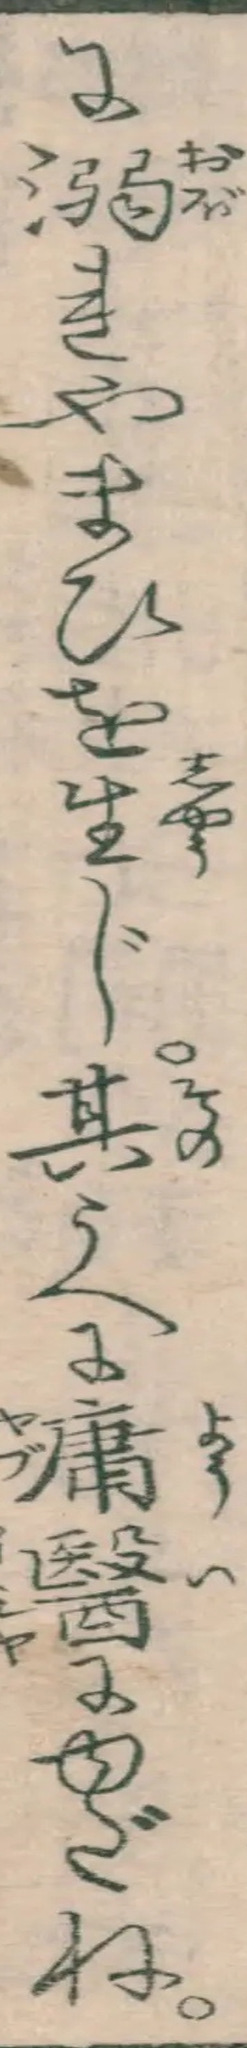に溺れやまひを生じ。其うへに庸平醫にゆだね。
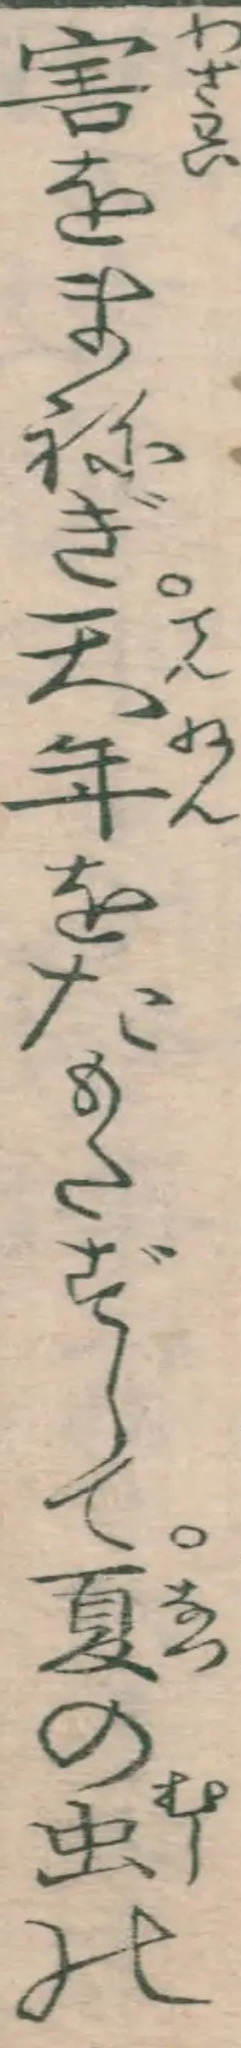害をまねぎ。天年をたもたずして。夏の虫の
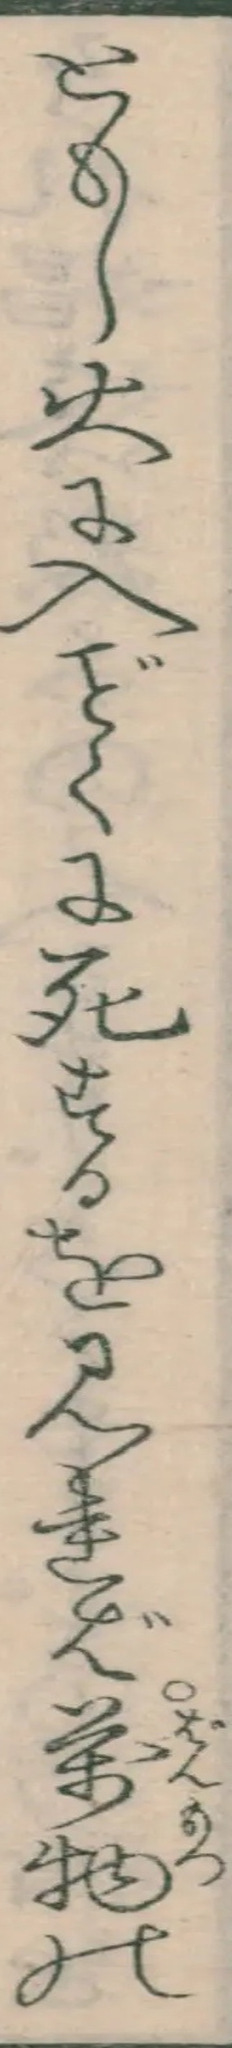ともし火に入ごとくに死するを見れば。萬物の
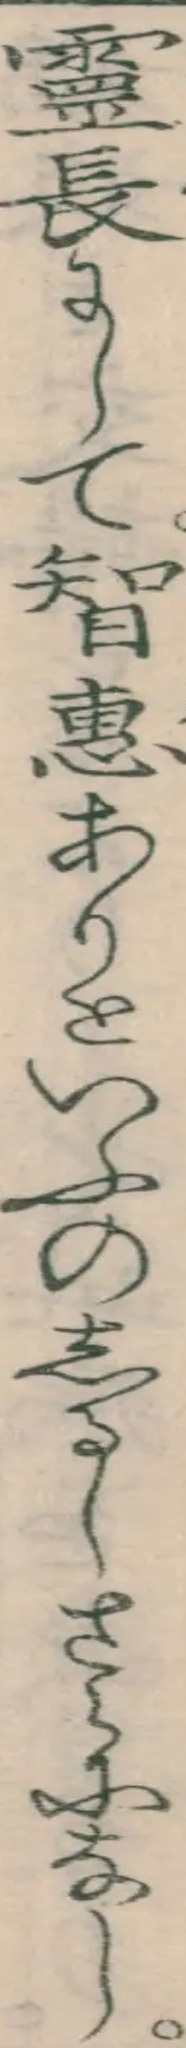霊長にして。智恵ありといふのしるしさらになし。
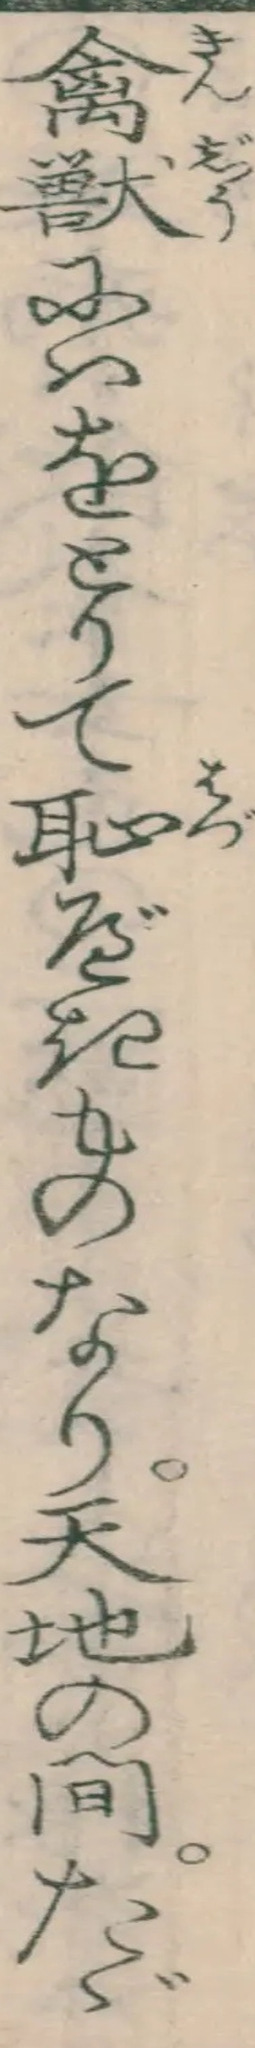禽獣にはをとりて恥べきものなり。天地の間。たゞ
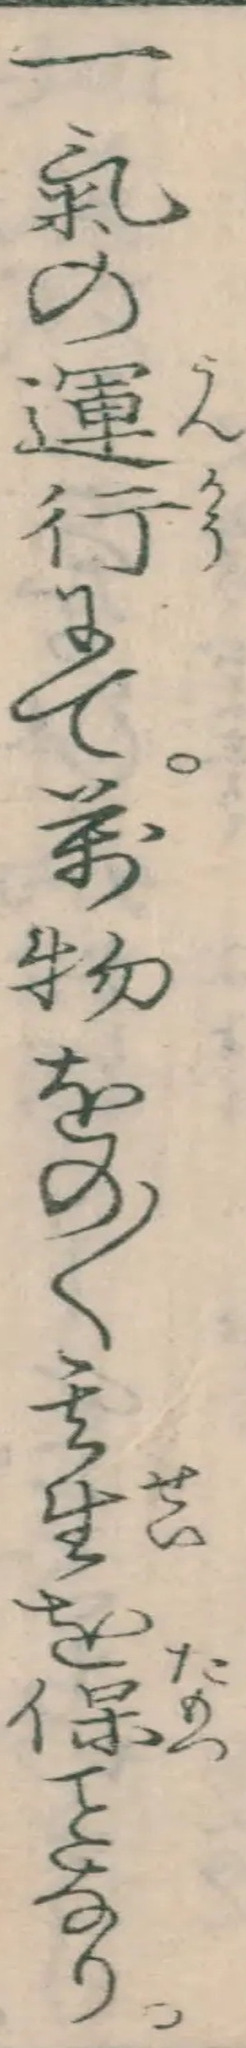一氣の運行にて。萬物をの〳〵其生を保ことなり。
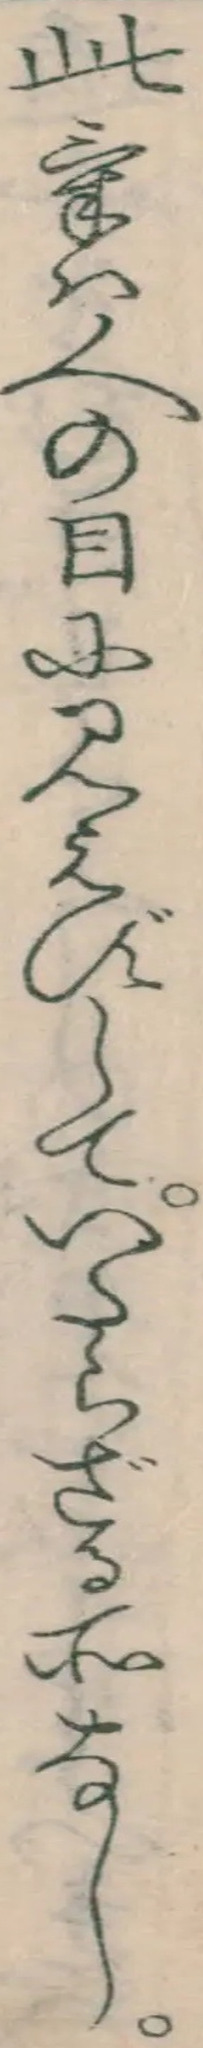此氣は人の目に見えずして。いたらざる所なし。
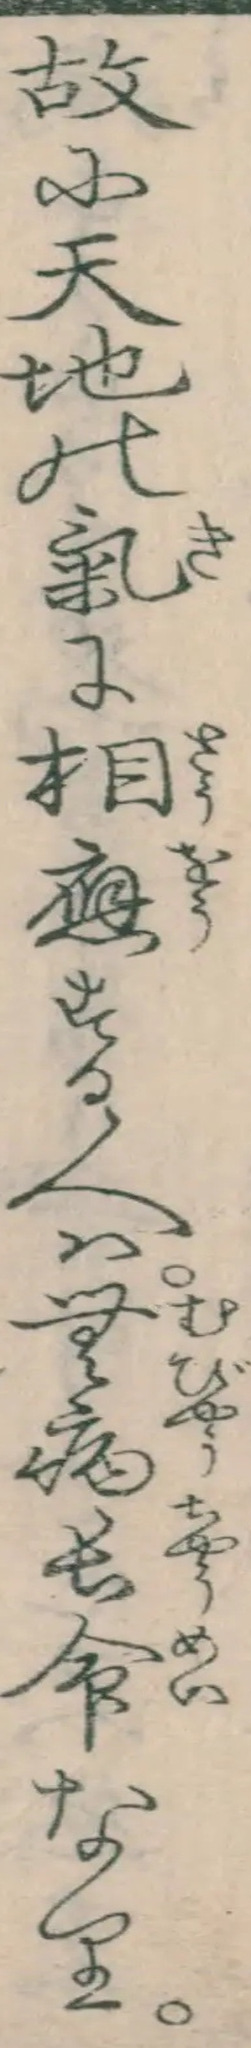故に天地の氣に相応する人は。無病長命なり。
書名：瘡家示訓
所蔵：国立国会図書館 National Diet Library, JAPAN
